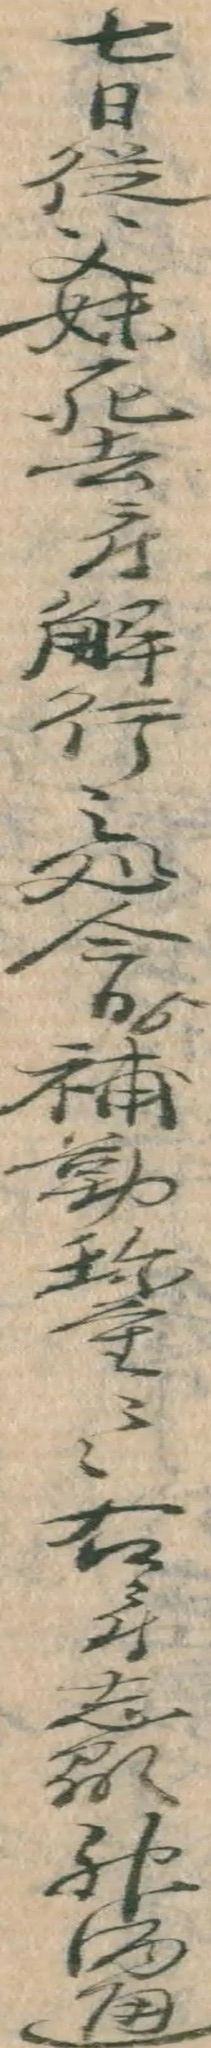七日従父妹死去ニ付解行之処今日ゟ補勤珍重々々右ニ付志顕神酒通
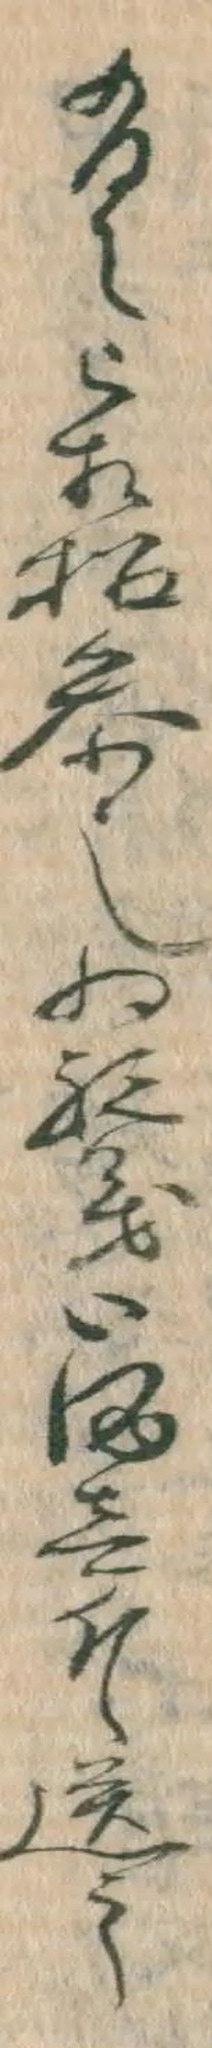有之被相招参也為祝義御酒壱升送了
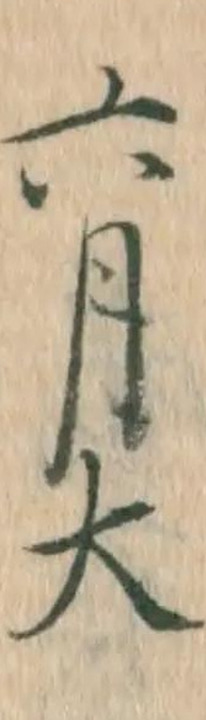六月大
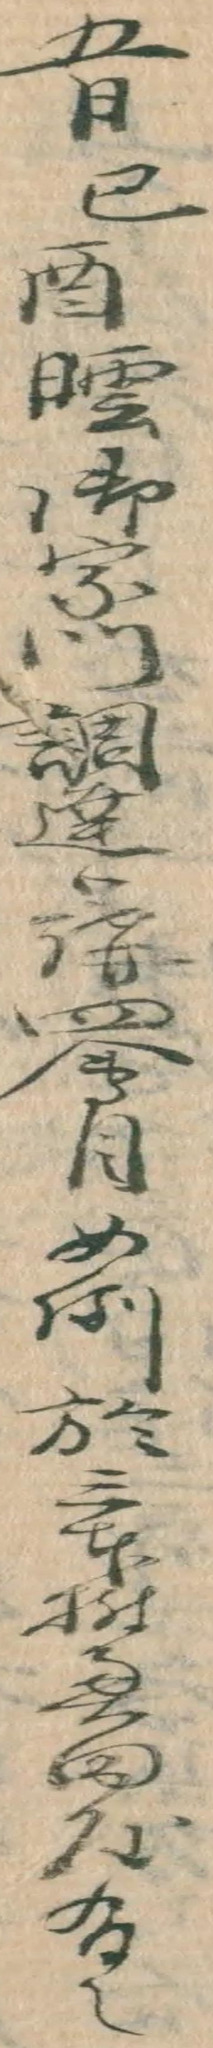五日己酉曇御家門調達御講四會目如例於三本附奥田屋有之
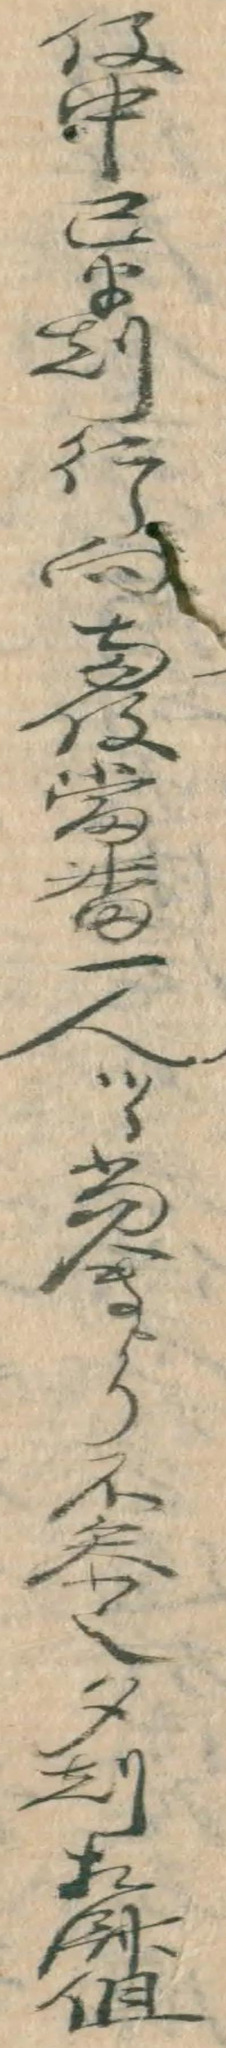役中巳半刻行向両役當番一人ツヽ當會より不参也夕刻相済但
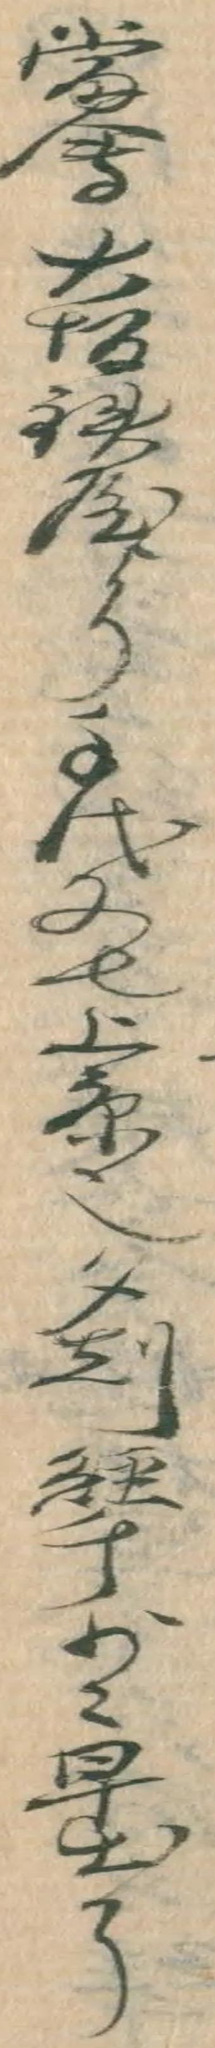當會大坂鉄屋より手代文七上京也夕刻経千少々早出了

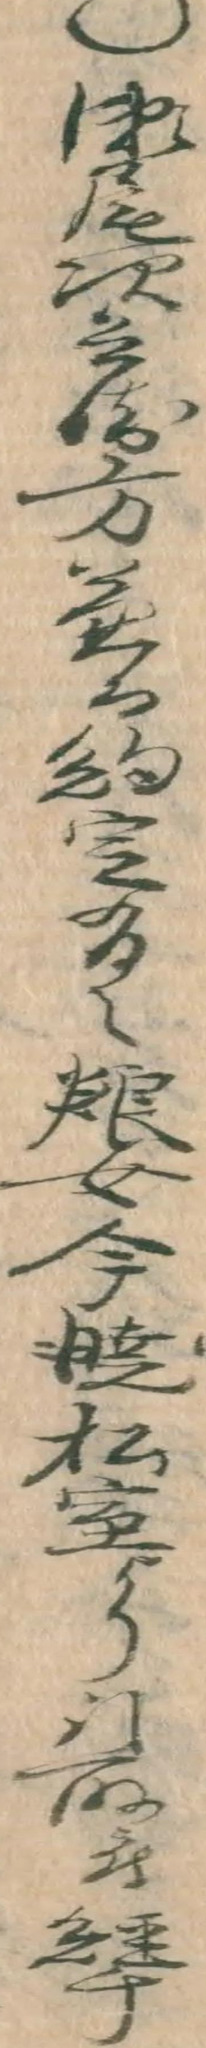〇瀬尾次兵衛方兼而約定有之養女今晩松室より引取ニ付経千
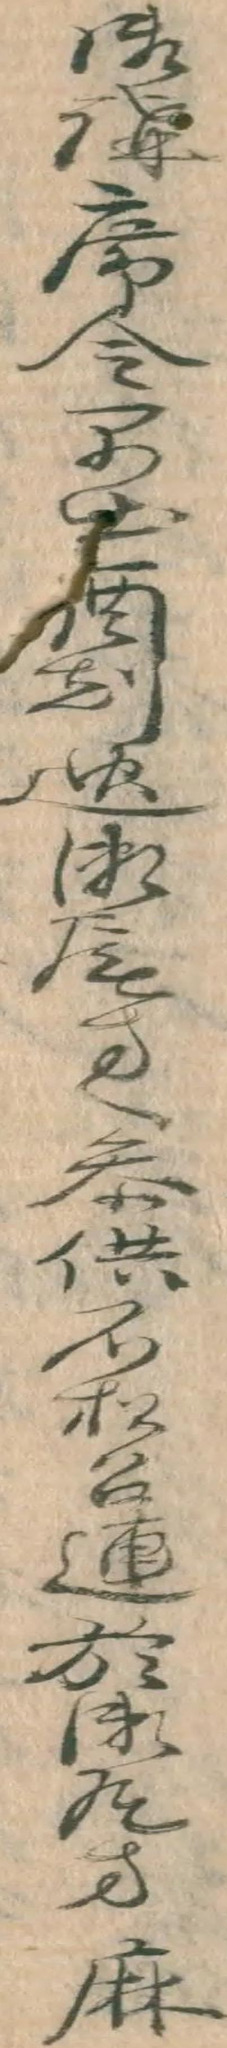御講席令早出酉刻過瀬尾方へ参供石松召連於瀬尾方麻
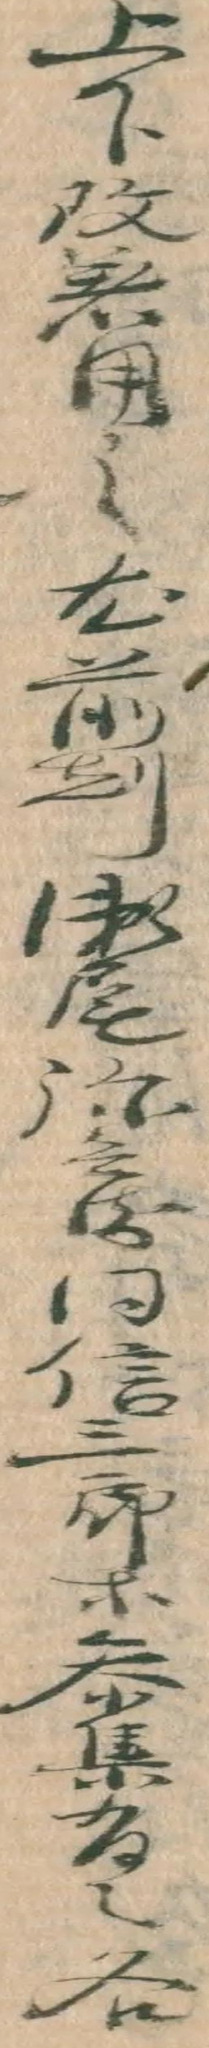上下改着用之尤前刻瀬尾弥兵衛同信三郎等参集有之各
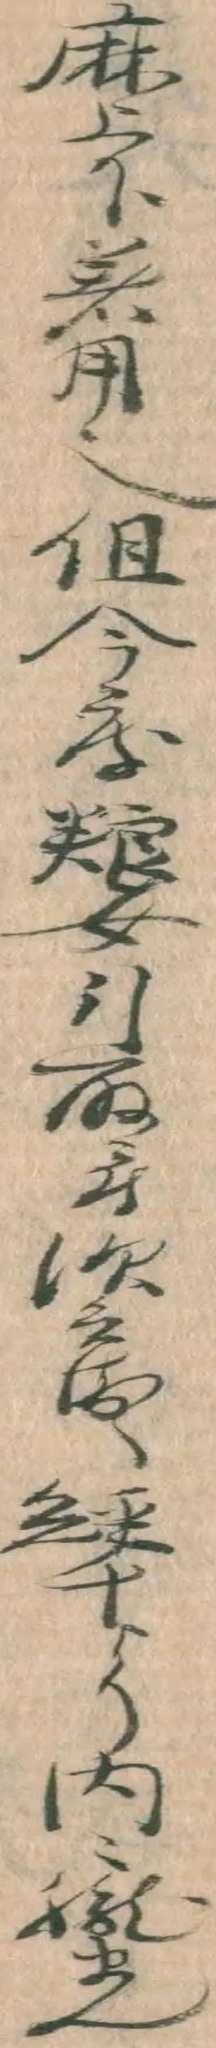麻上下着用也但今度養女引取ニ付次兵衛へ経千より内々瀧まん
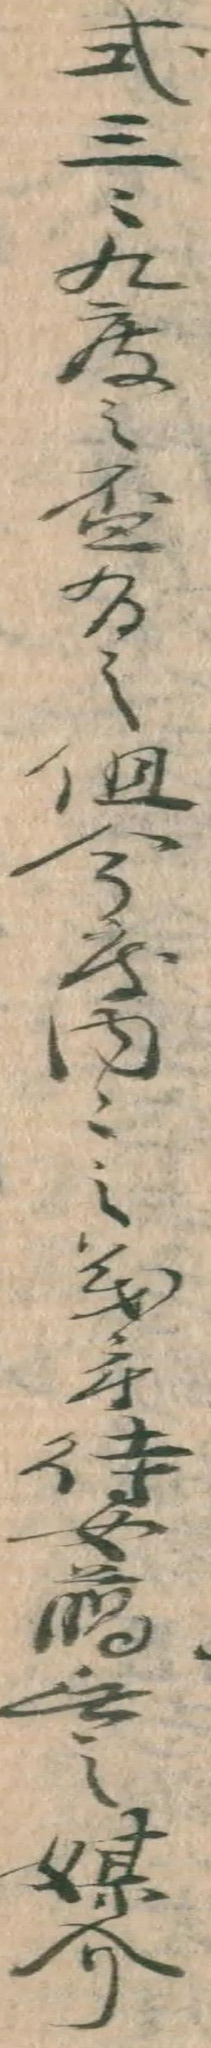式三々九度之盃有之但今度内々之義ニ付侍女臈無之媒介
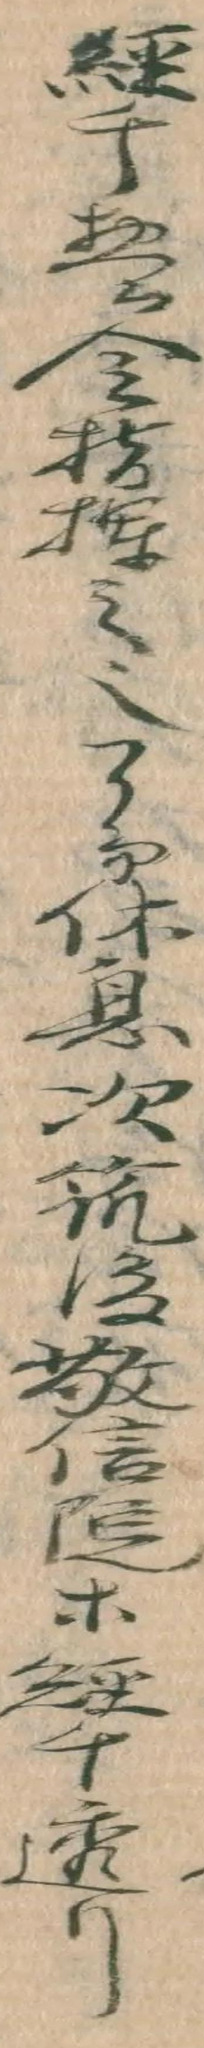経千惣而令指揮之也了而休息次筑後敬信院等経千透引
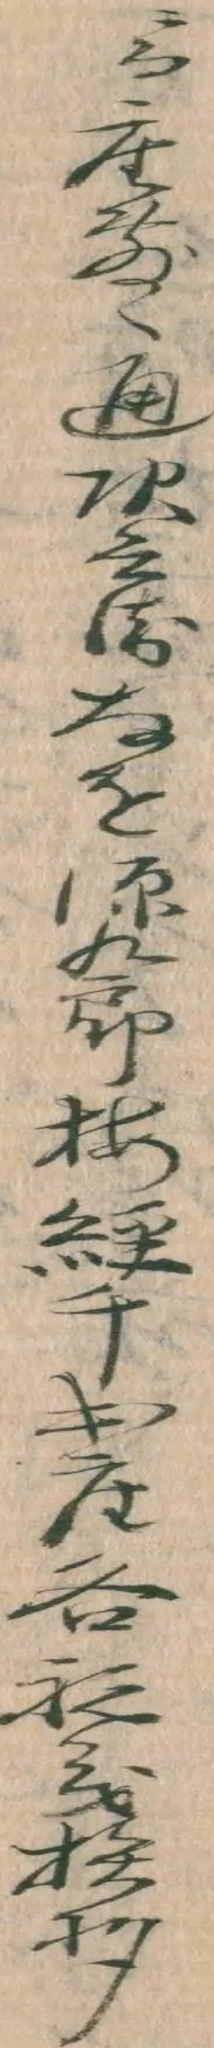ニ而座敷ヘ通次兵衛なを源九郎梅経千本座各祝義挨拶
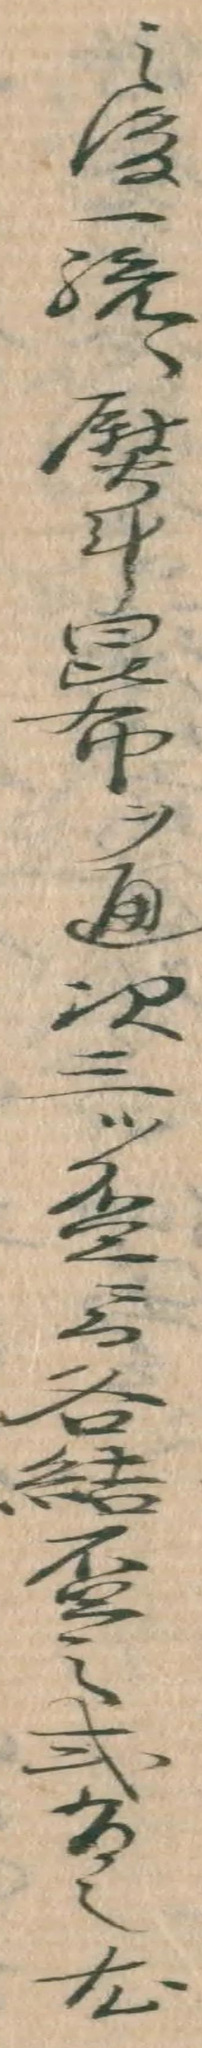之後一統へ熨斗昆布ヲ通次三ツ盃ニ而各結盃之式有之尤
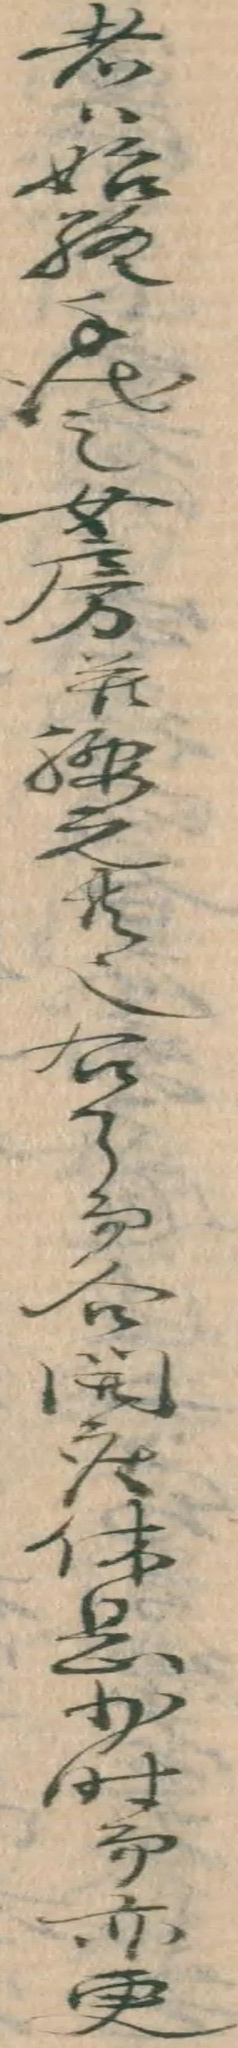者ハ始終手代之女房幷繰元共也右了而各開座休息少時而亦更
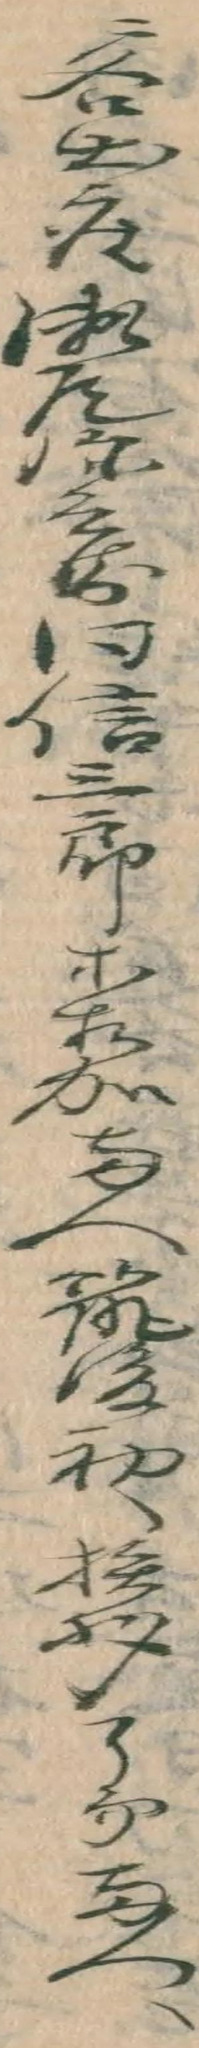ニ各出座瀬尾弥兵衛同信三郎等相加両人筑後初へ挨拶了而両人へ
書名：賀茂社記録. 第65冊
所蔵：国立国会図書館 National Diet Library, JAPAN
